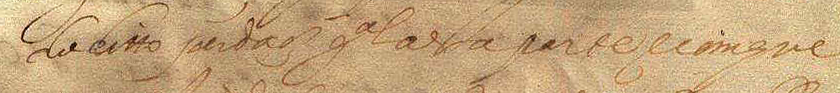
do ditto perdaõ gal a esta parte e com que
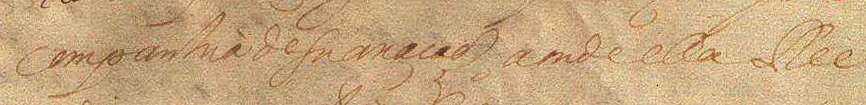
companhia de sua naçaõ aonde ella Ree
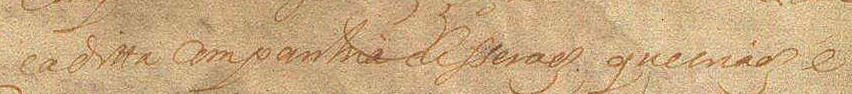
e a ditta companhia disseraõ que criaõ e
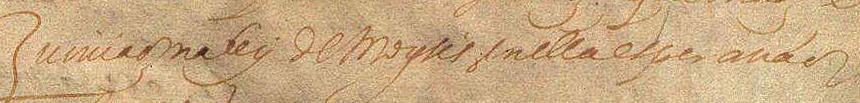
uiuiaõ na ley de moyses e nella esperauão
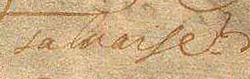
saluarse
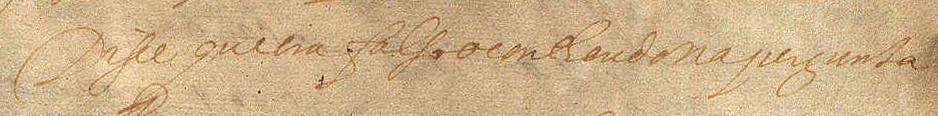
Disse que era falso o contheudo na pergunta
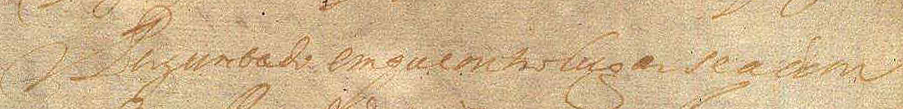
Perguntado em que outro lugar se achou
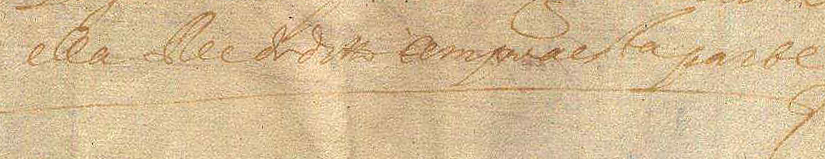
ella Ree do ditto tempo a esta parte
